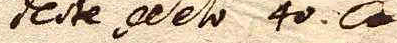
deste selo 40.
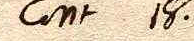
cont 18.
